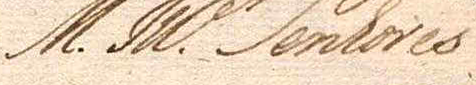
M. Ill.es Senhores
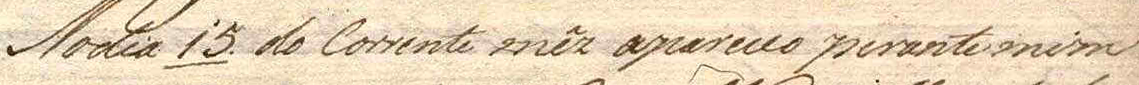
No dia i5. do corrente mêz apareceo perante mim
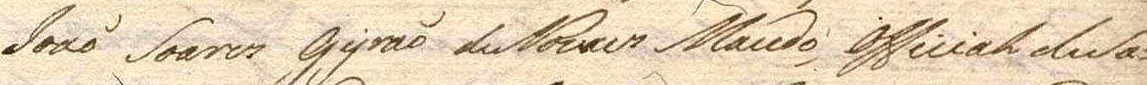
Ioaõ Soares Gyraõ de Novaes Macedo, OfficiaL de Sa
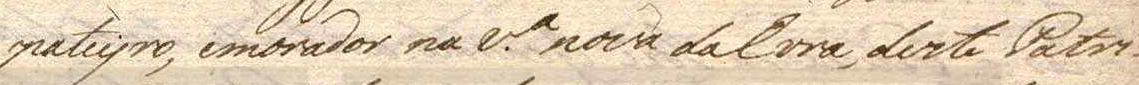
pateyro, e morador na v.a nova da Erra, dezte Patri
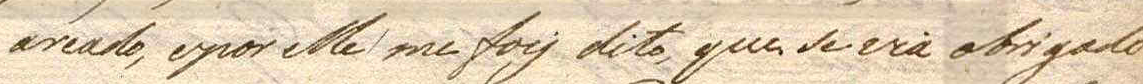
arcado, e por elle me foy dito, que se via obrigado
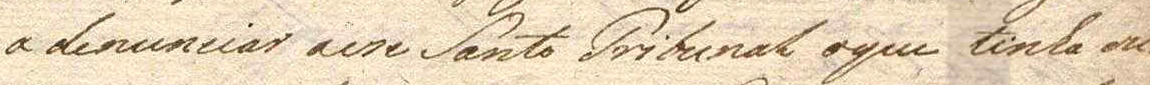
a denunciar a ese Santo TribunaL o que tinha ou
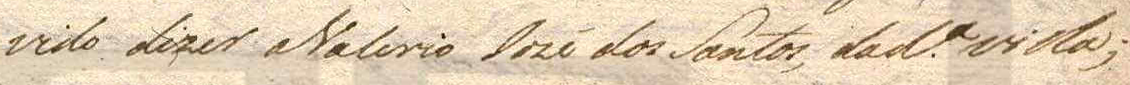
vido dizer a Valerio Iozé dos Santos, da d.a villa;
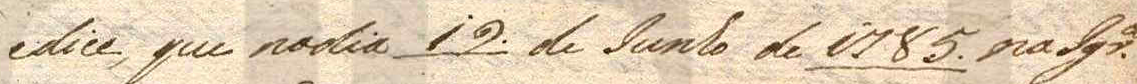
e dice, que no dia i2 de Iunho de i785 na Igr.a
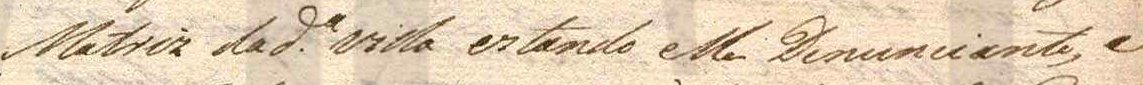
Matriz da d.a villa estando elle Denunciante, e
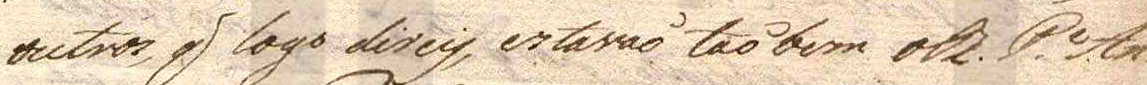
outros, q̄ logo direy, estavaõ taõbem o R. P.e An
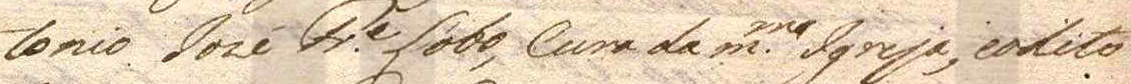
tonio Iozé Fr.e Lobo, Cura da m.ma Igreja, e o dito
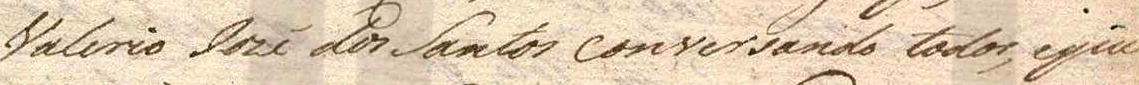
Valerio Iozé dos Santos conversando todos, e que
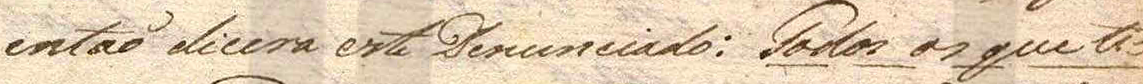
entaõ dicera este Denunciado: Todos os que ti
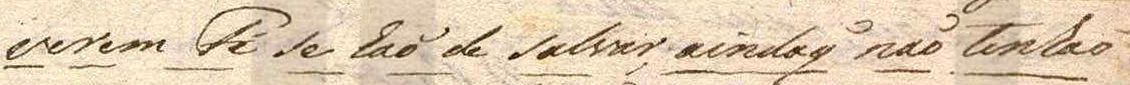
verem Fé se haõ de salvar ainda q̄ naõ tenhaõ
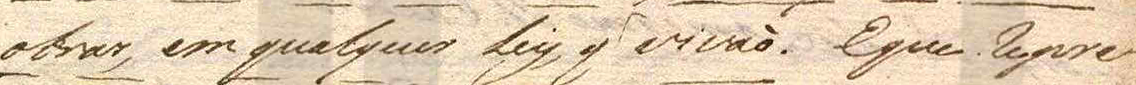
obras, em qualquer Ley q̄ vivaõ. E que Repre
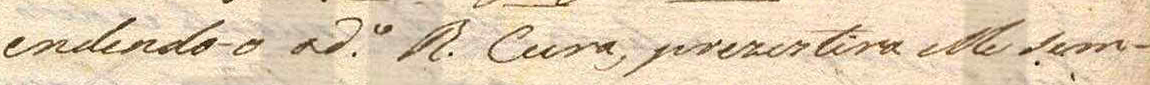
endendo-o o d.o R. Cura, prezestira elle sem
